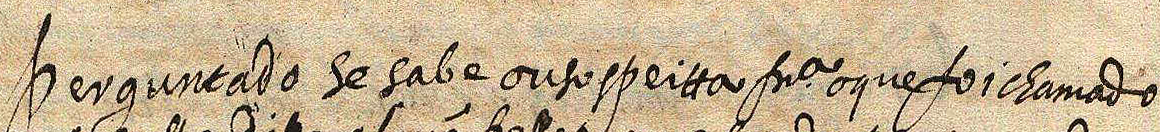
perguntado se sabe ou sospeitta pr.a o que foi chamado
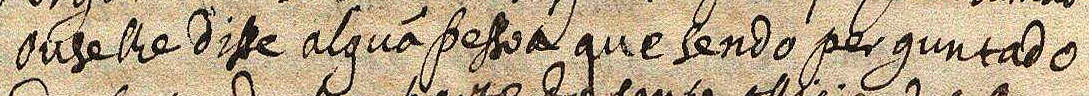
ou se lhe disse alguā pessoa que sendo perguntado
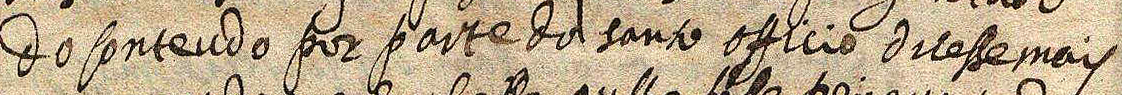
do Conteudo por parte do santo officio dicesse mais
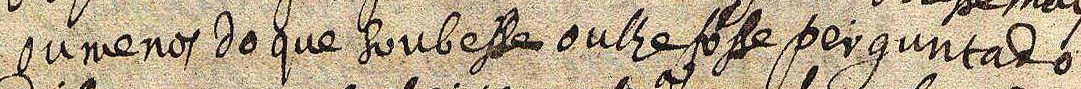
ou menos do que soubesse ou lhe fosse perguntado
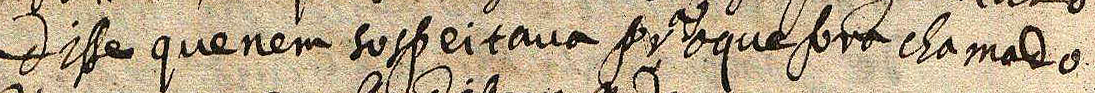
disse que nem sospeitaua pra o que fora chamado
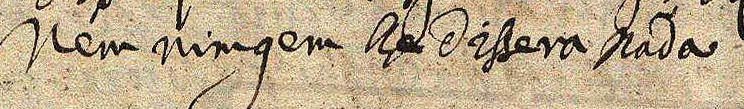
nem nimgem lhe dissera nada
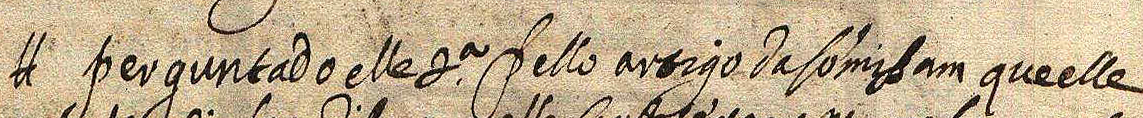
item perguntado elle t.a pello artigo da Com̄issam que elle
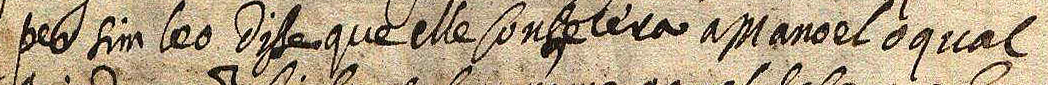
per sim leo disse que elle Conhecera a manoel o qual
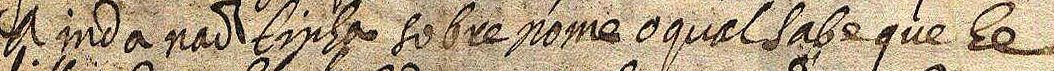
ainda naõ tinha sobrenome o qual sabe que he
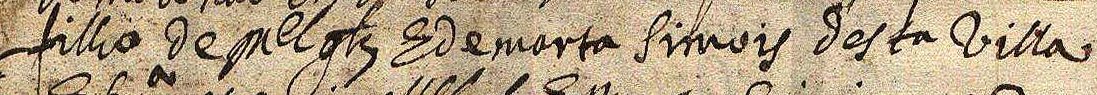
filho de mel gl̄z E de marta simois desta villa
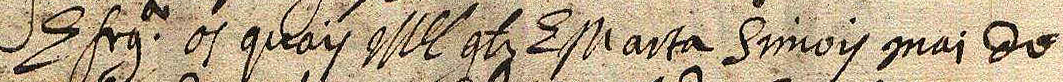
E freg.a os quais Mel gl̄z E Marta Simois mai do
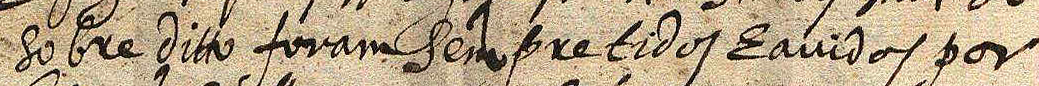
sobreditto foram sempre tidos E auidos por
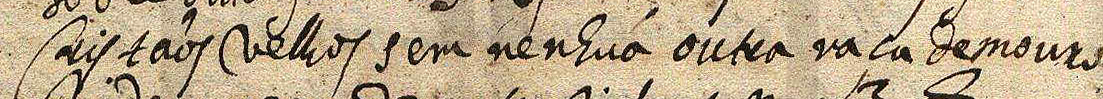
Cristaõs velhos sem nenhuā outra raça de mouro
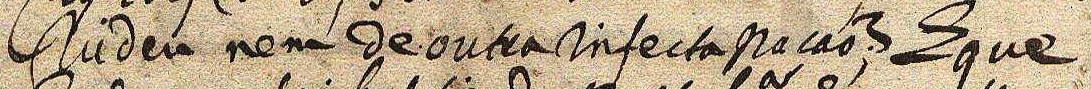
Iudeu nem de outra infecta naçaõ; E que
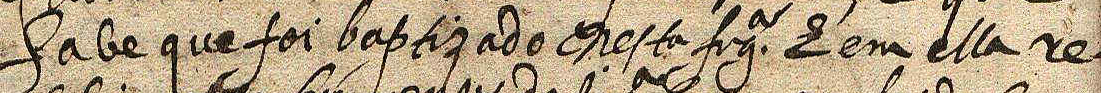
sabe que foi baptizado nesta frg.a E em ella re
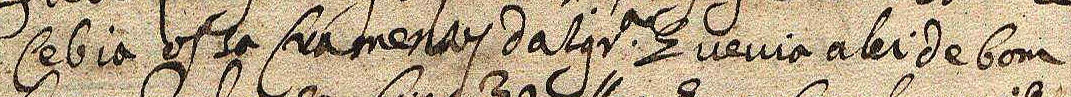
cebia os saCramentos da Igr.a E ueuia a lei de bom
